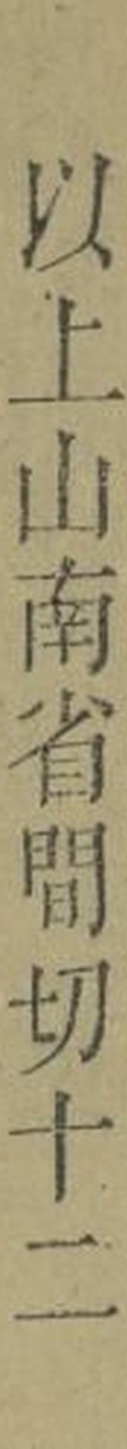以上山南省間切十二

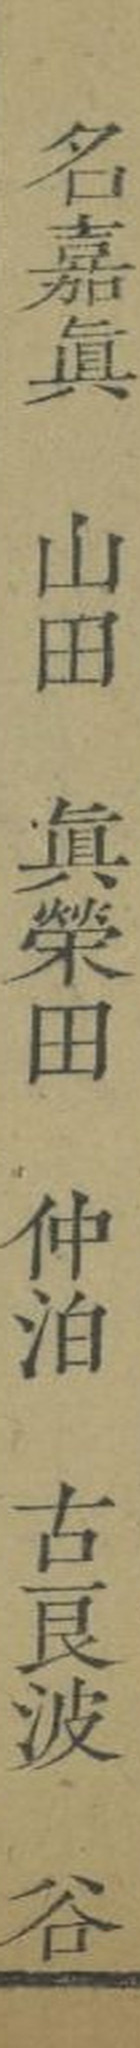名嘉真山田真栄田仲泊古良波谷
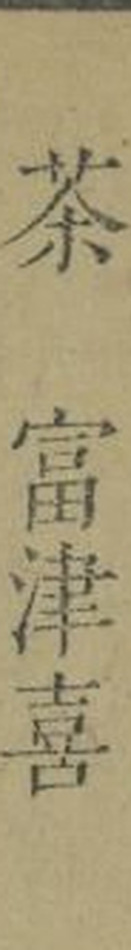茶富津喜
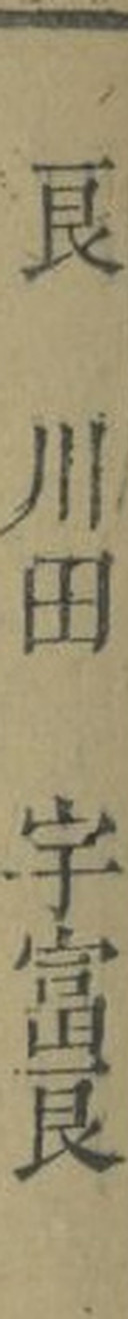良川田宇富良
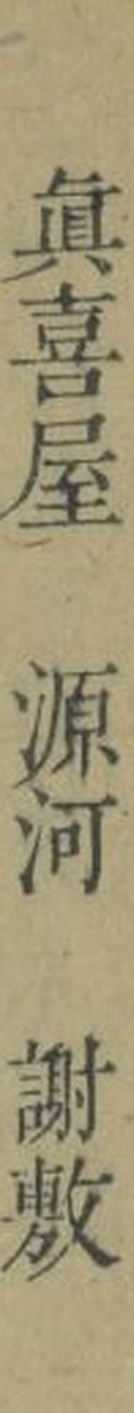真喜屋源河謝敷

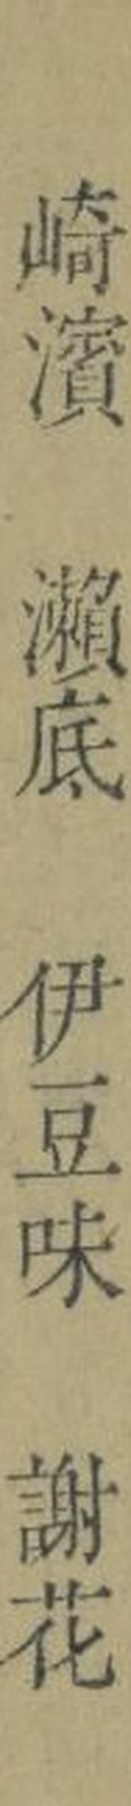崎浜瀬底伊豆味謝花
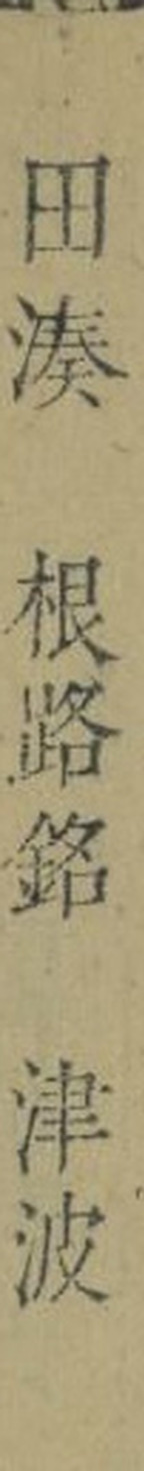田湊根路銘津波
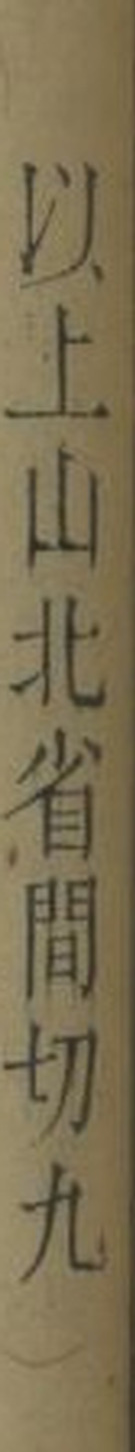以上山北省間切九
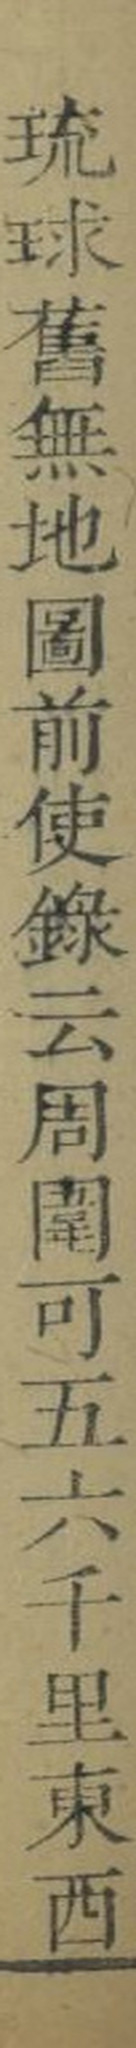琉球旧無地図前使録云周囲可五六千里東西
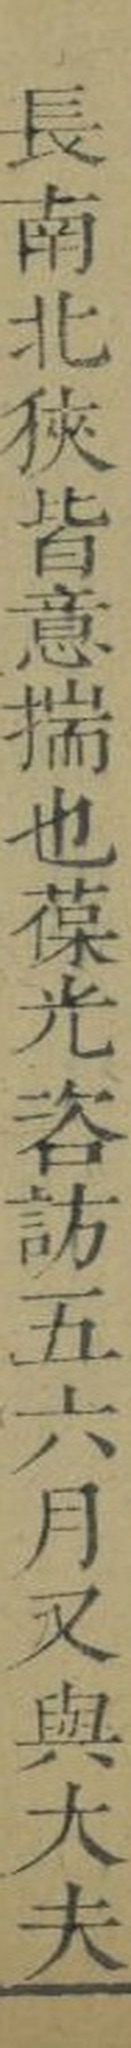長南北狭皆意揣也葆光咨訪五六月又与大夫
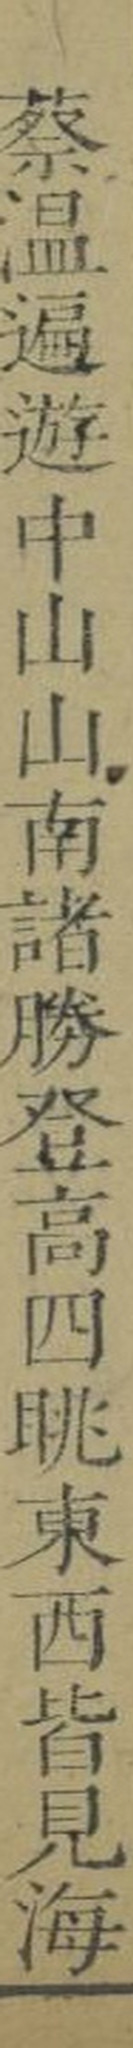蔡温遍遊中山山南諸勝登高四眺東西皆見海
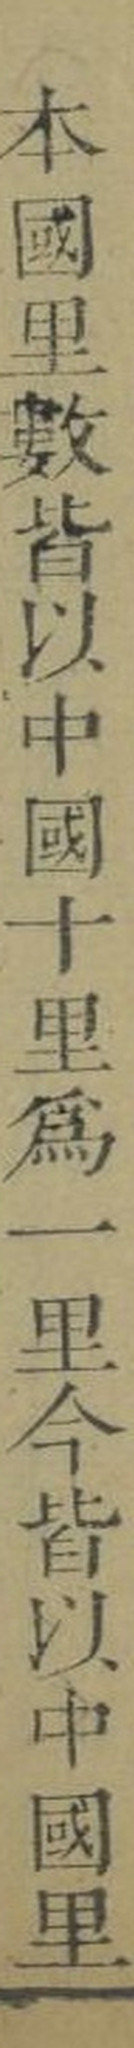本国里数皆以中国十里為一里今皆以中国里
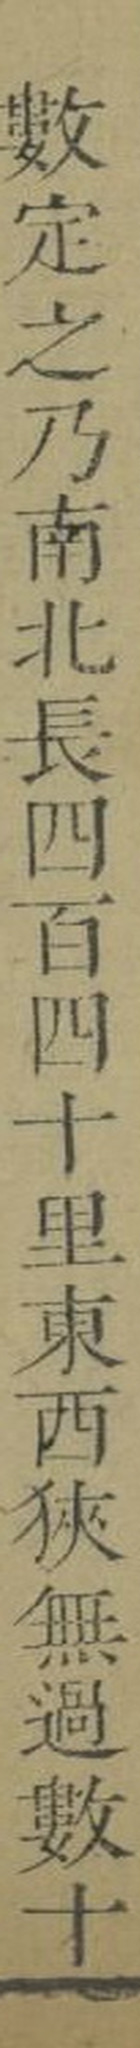数定之乃南北長四百四十里東西狭無過数十
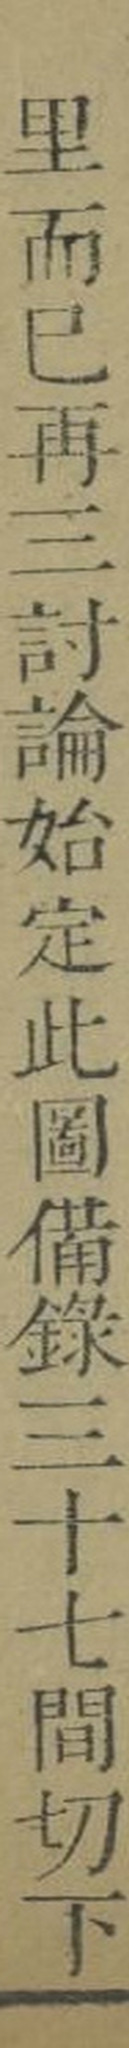里而巳再三討論始定此図備録三十七間切下
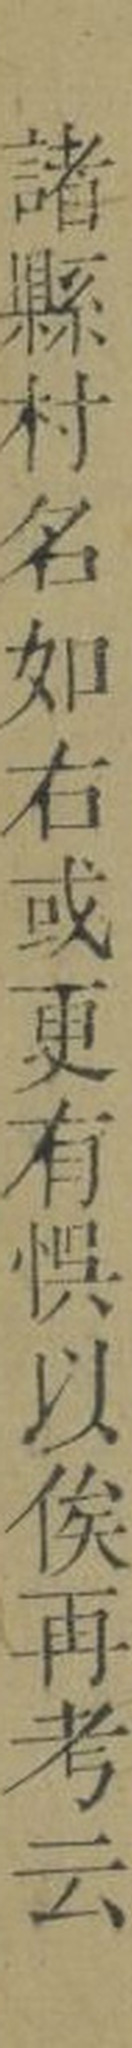諸県村名如右或更有悞以俟再考云

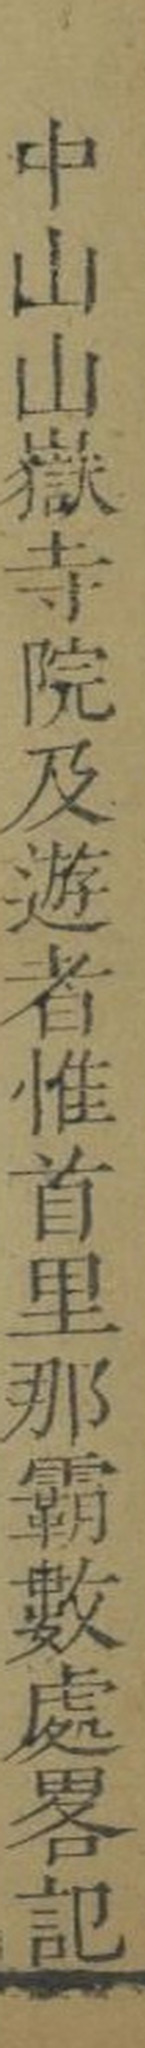中山山岳寺院及遊者惟首里那覇数処略記
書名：中山伝信録 巻四
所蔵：University of the Ryukyus Library
